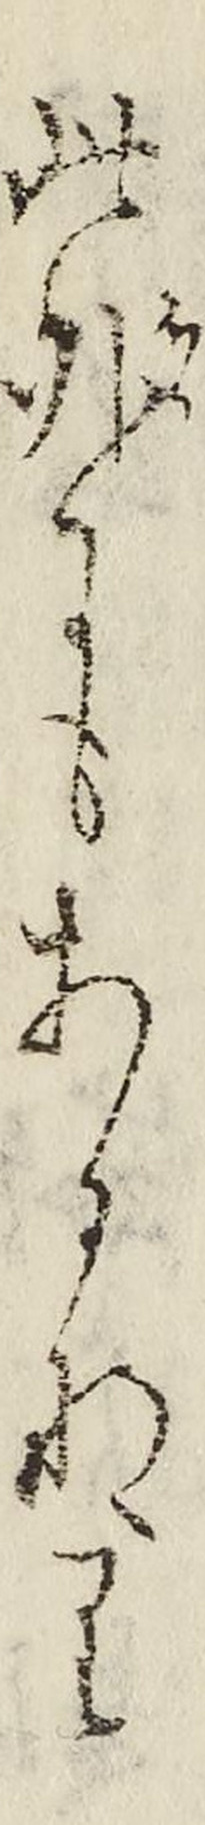此外にもあるなり
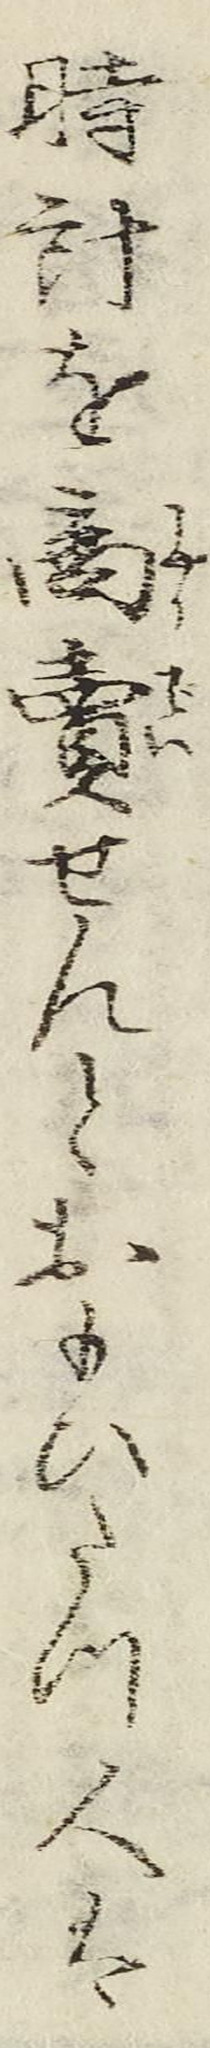時計を商売せんとおもひたつ人は
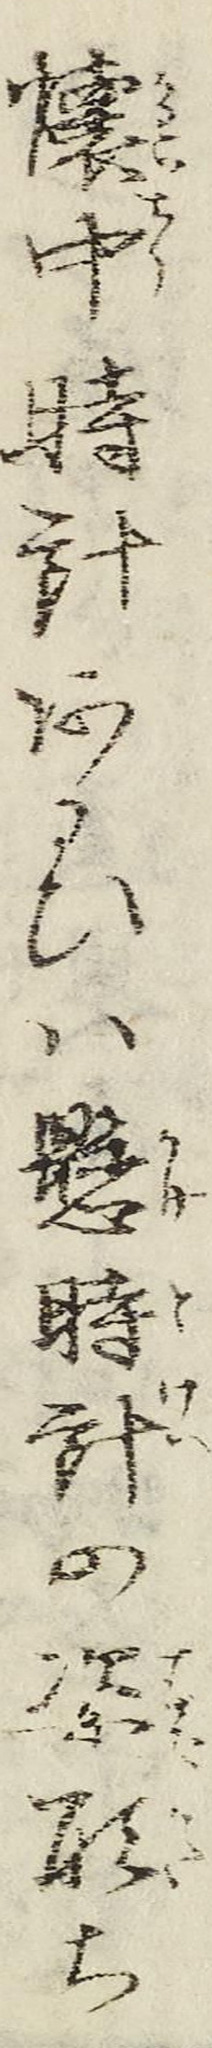懐中時計あるひは懸時計の姿形ち
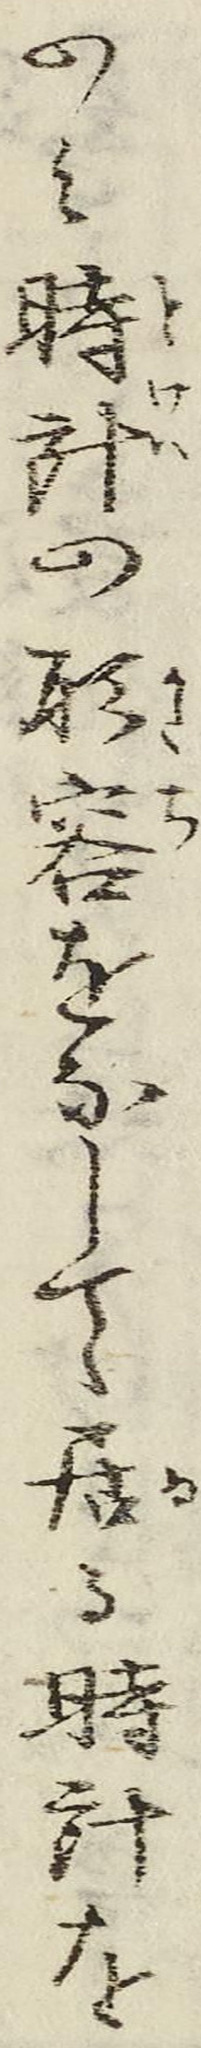のみ時計の形容をなして居る時計を
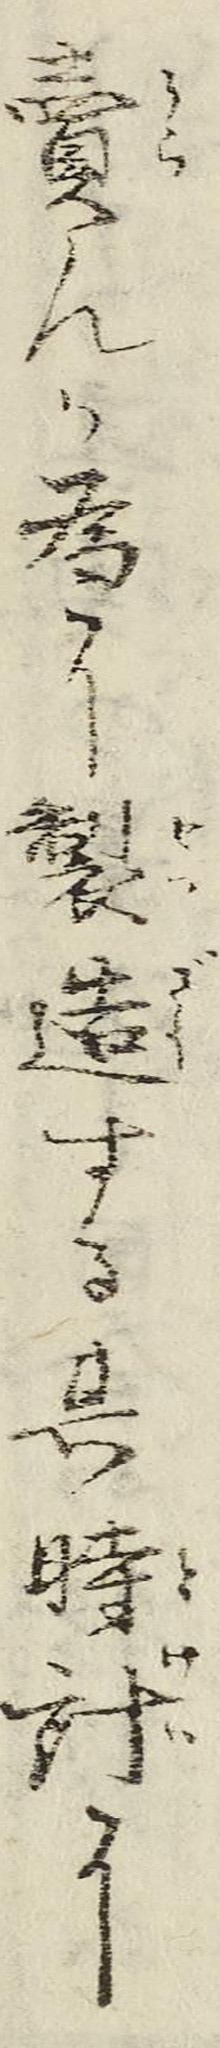売んか為に製造する其時計に
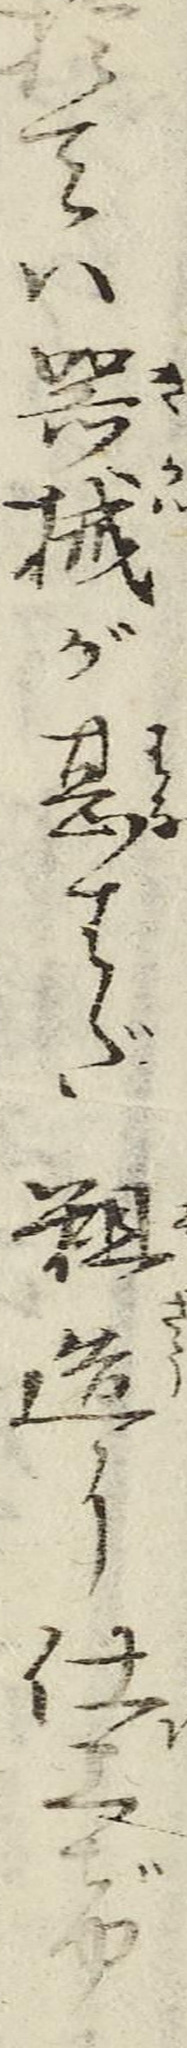於ては器械が甚はだ粗造に仕上げ
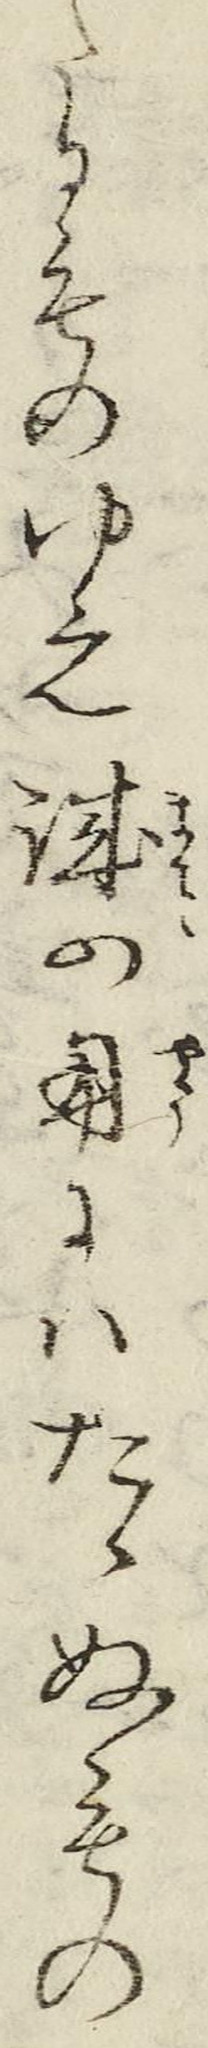たるそのゆえ誠の用にはたゝぬもの
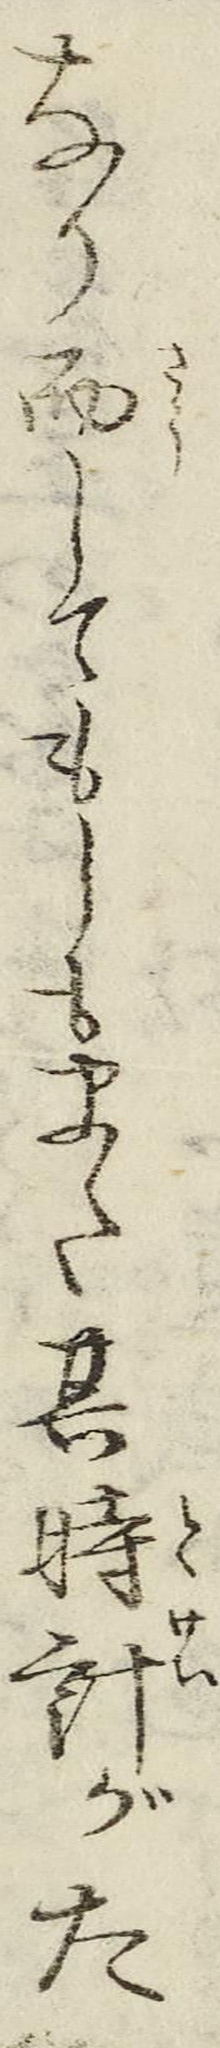なり而してもしもまた其時計がた
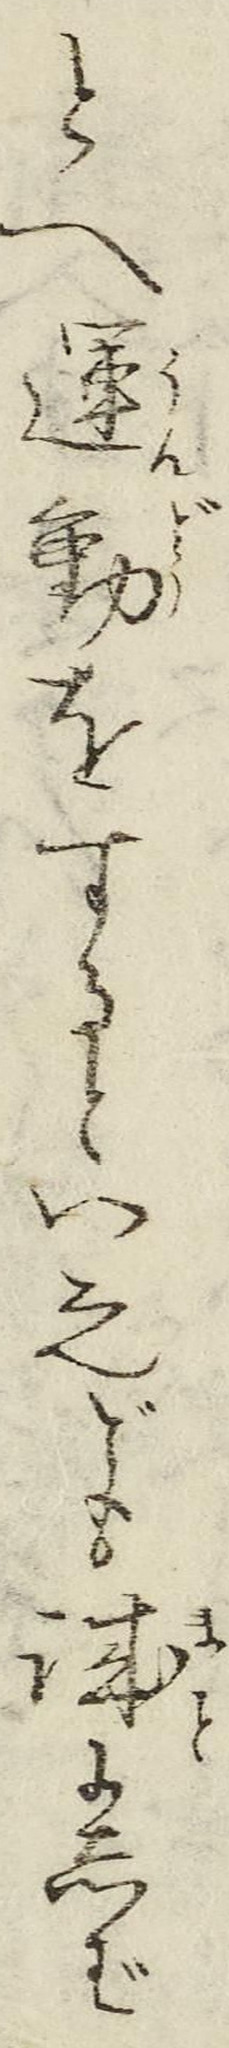とへ運動をするといえども誠にしば
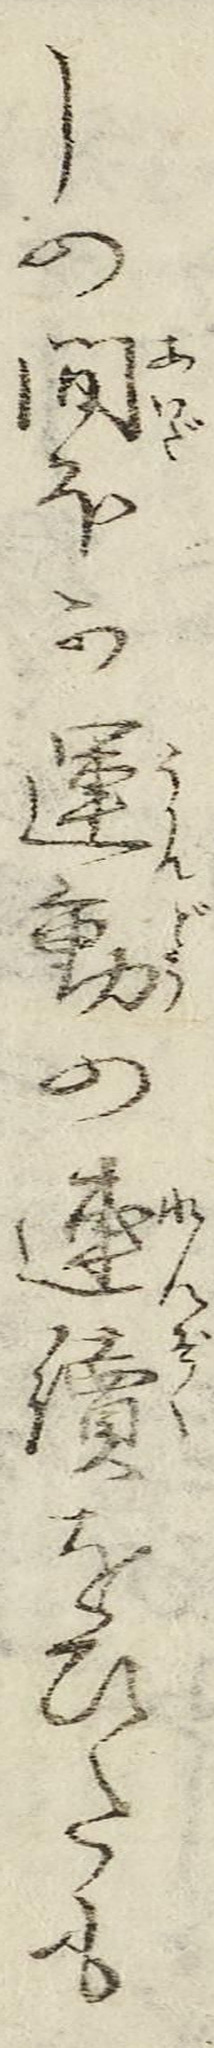しの間ほか運動の連続をひたも
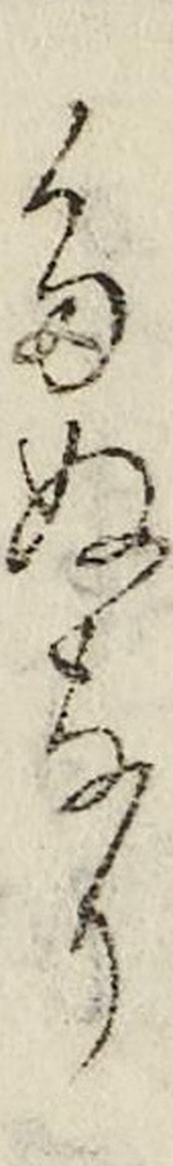たぬなり
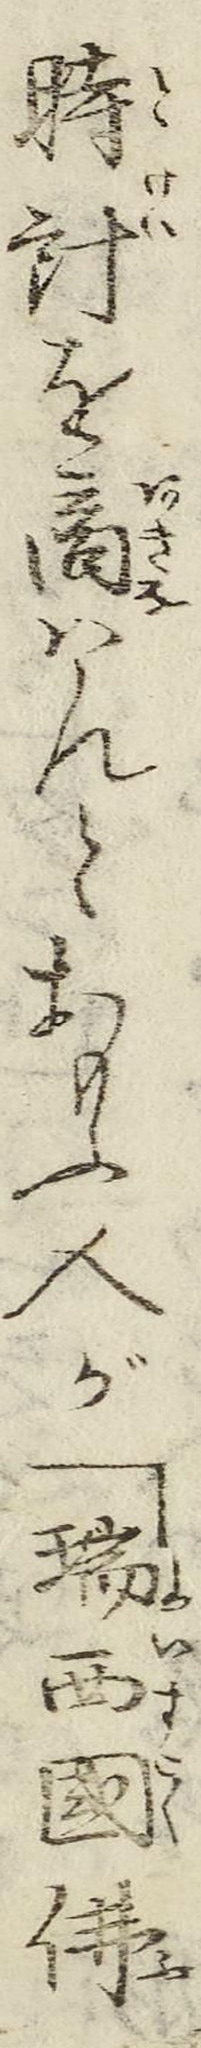時計を商はんとおもふ人が「瑞西国佛
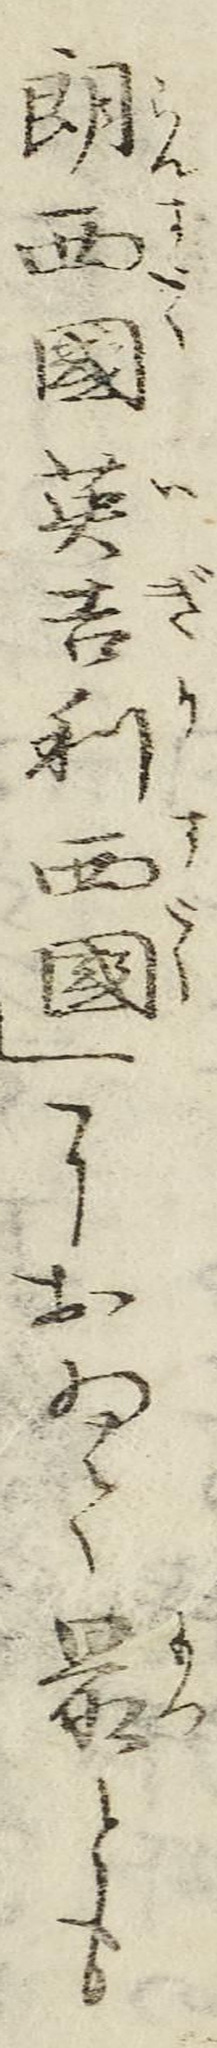朗西国英吉利西国」におゐて最とも
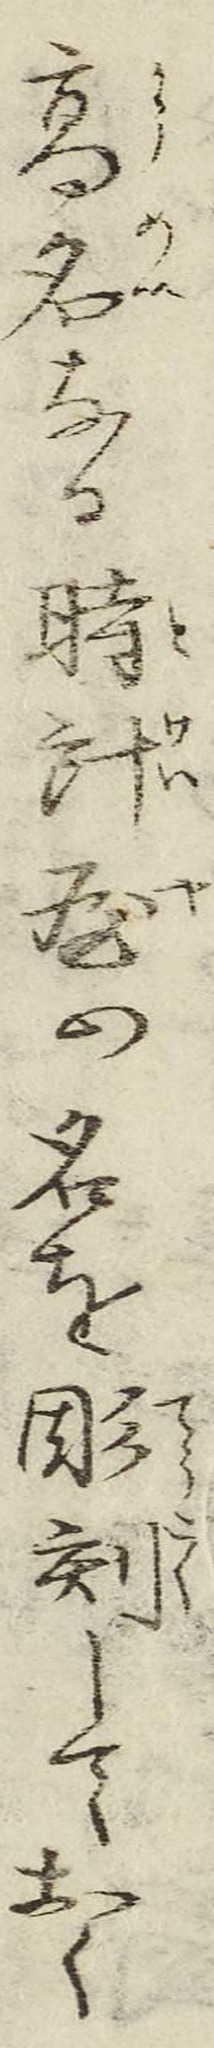高名なる時計屋の名を彫刻しておく

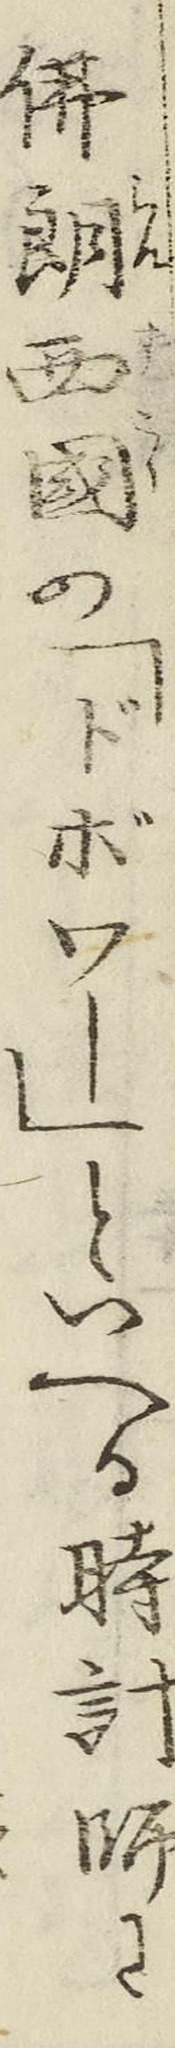佛朗西国の「ドボワー」といへる時計師に
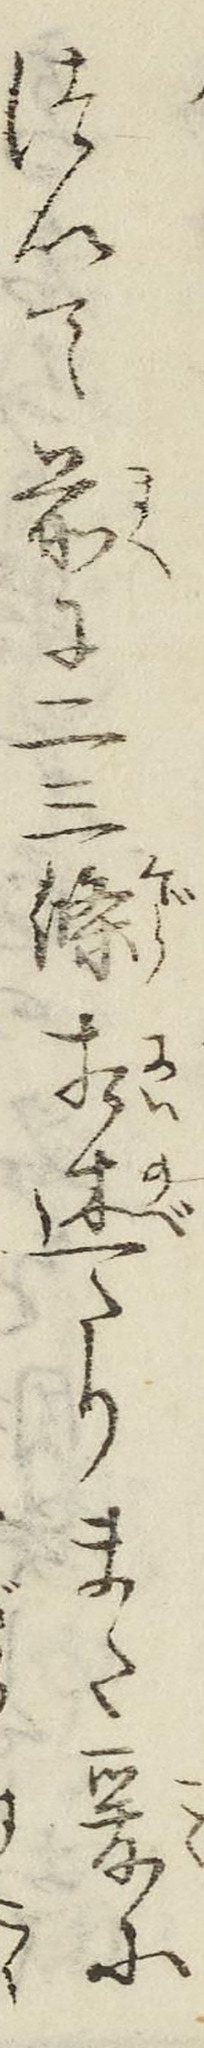ついて前に二三條相述たりまた爰に
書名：[時計に関する冊子]
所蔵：東京大学地震研究所図書室 Earthquake Research Institute Library, The University of Tokyo, JAPAN
